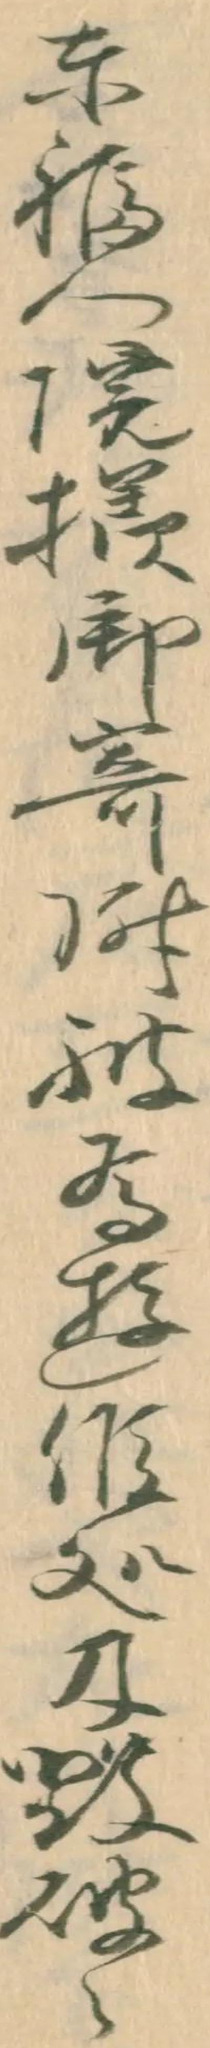東福門院様御寄附被為遊候処及毀破候
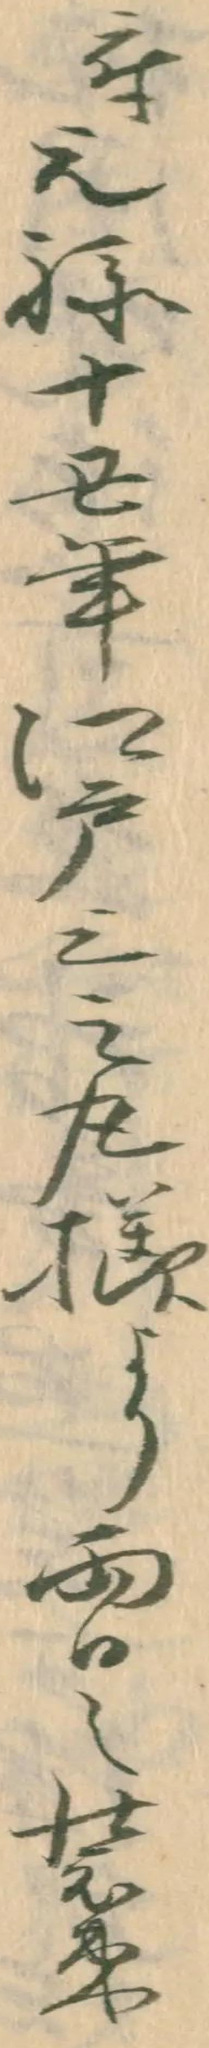ニ付元禄十丑年江戸三之丸様より両日之装束
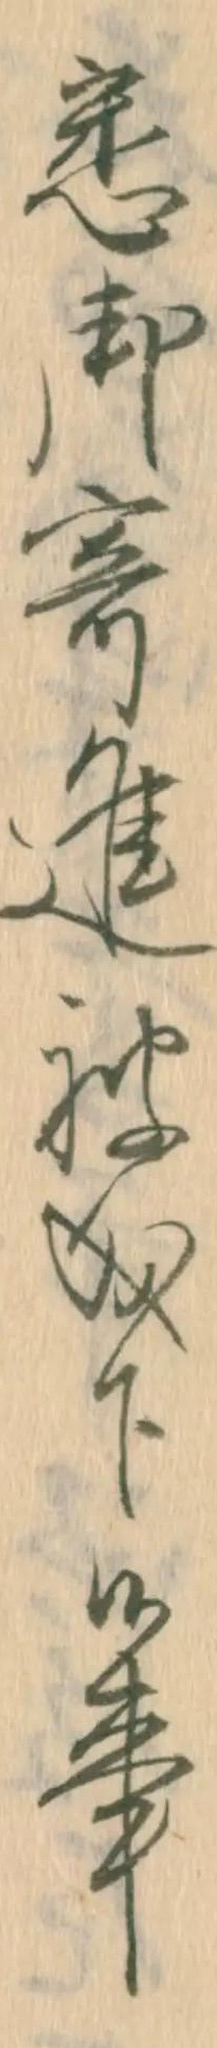悉御寄進被成下候事
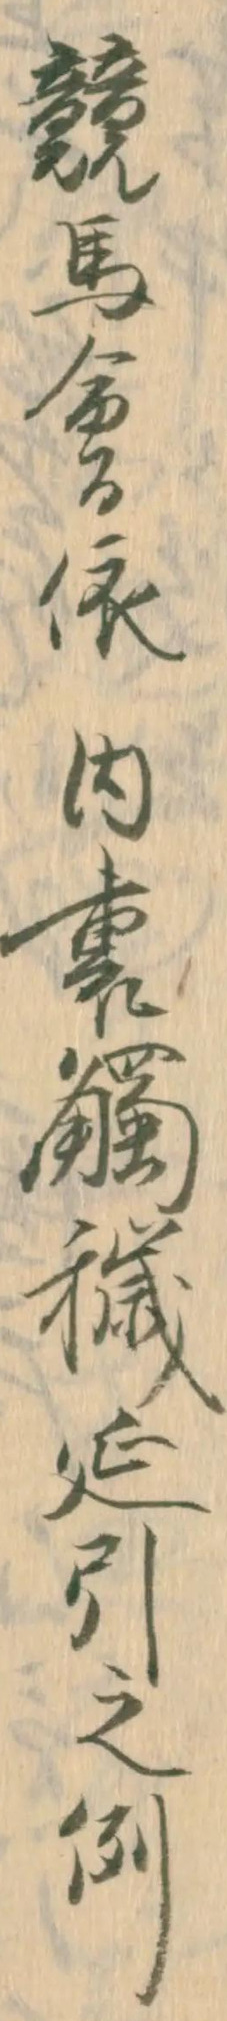競馬会依内裏触穢延引之例
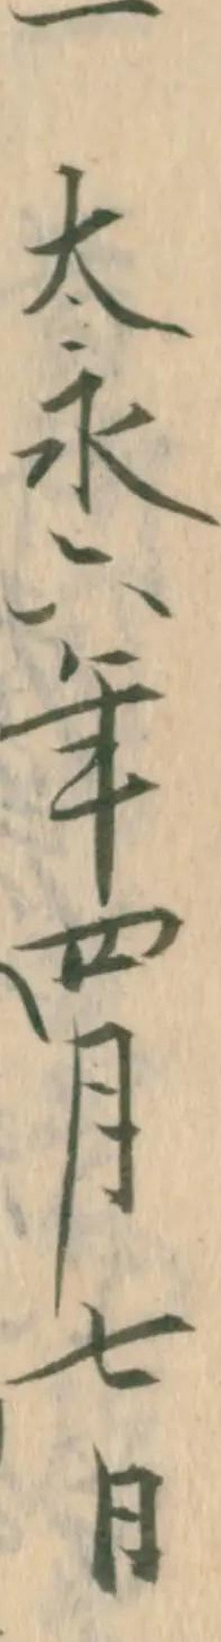一太永六年四月七日
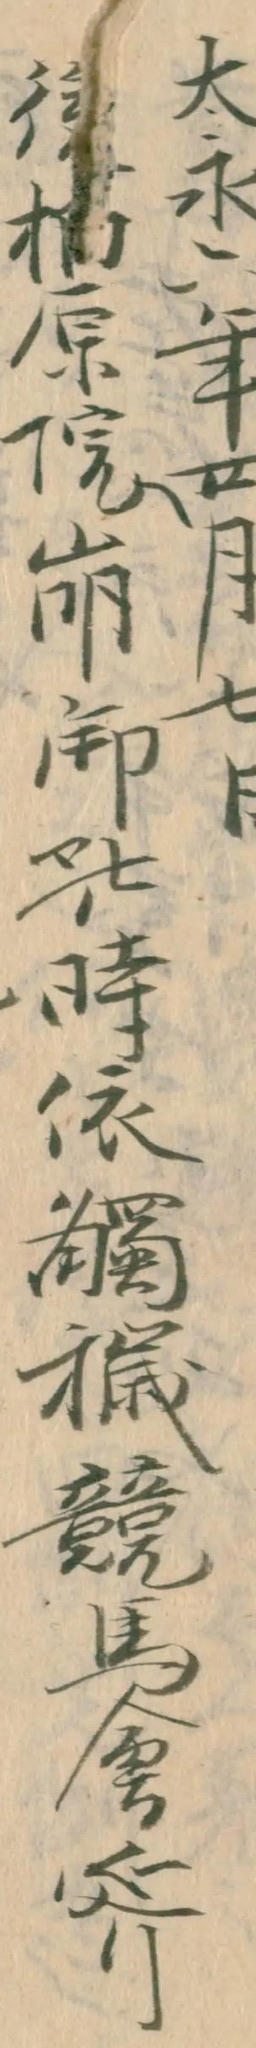後柏原院崩御此時依触穢競馬会延引
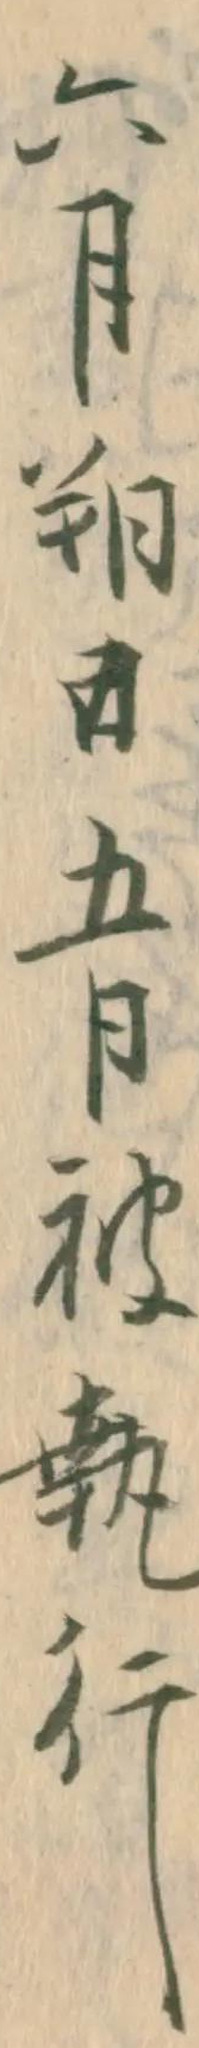六月朔日五日被執行
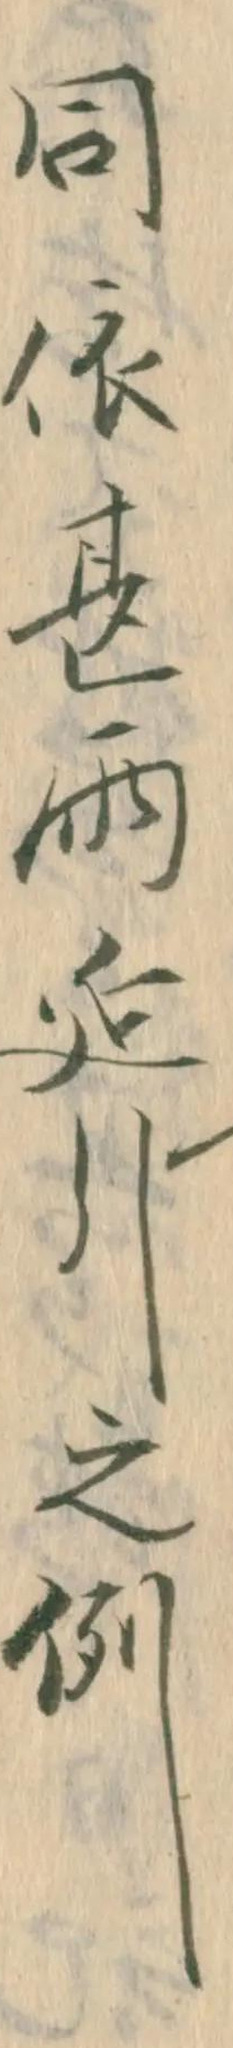同依甚雨延引之例
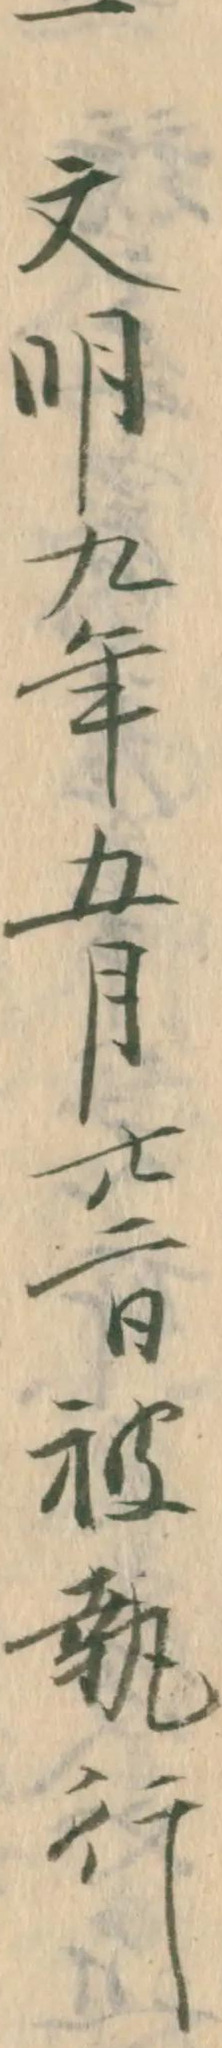一文明九年五月廿二日被執行
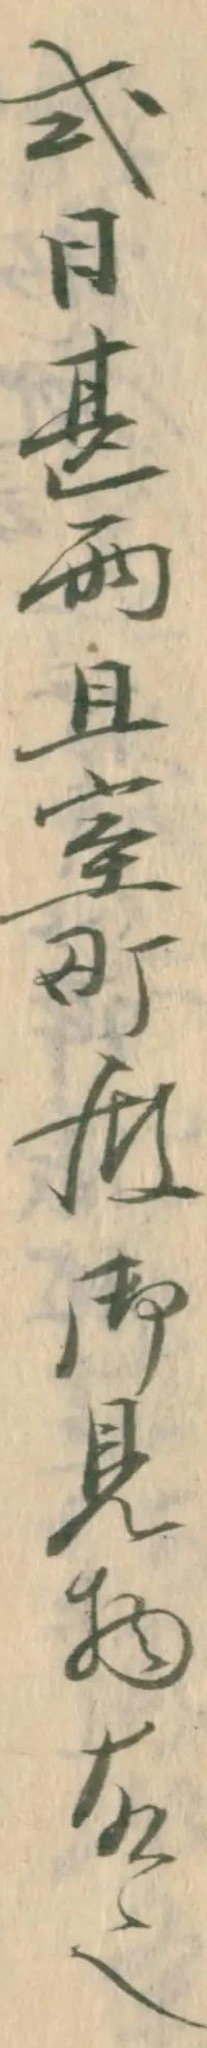式日甚雨且室町殿御見物故也
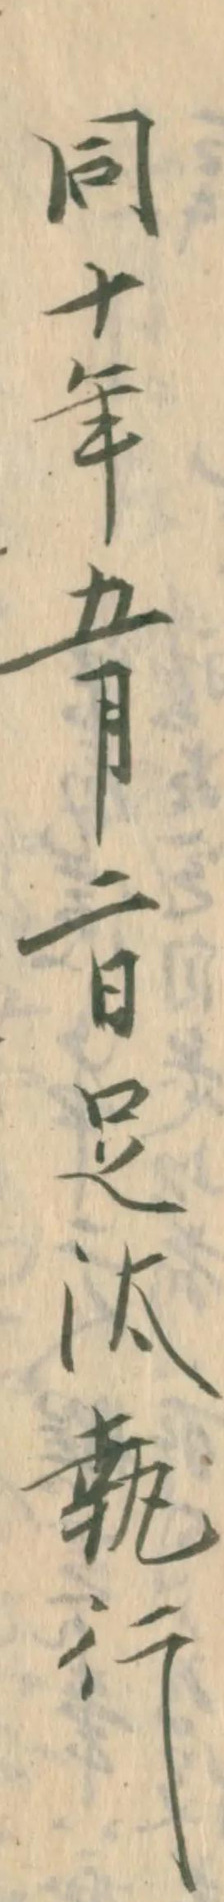一同十年五月二日足汰執行
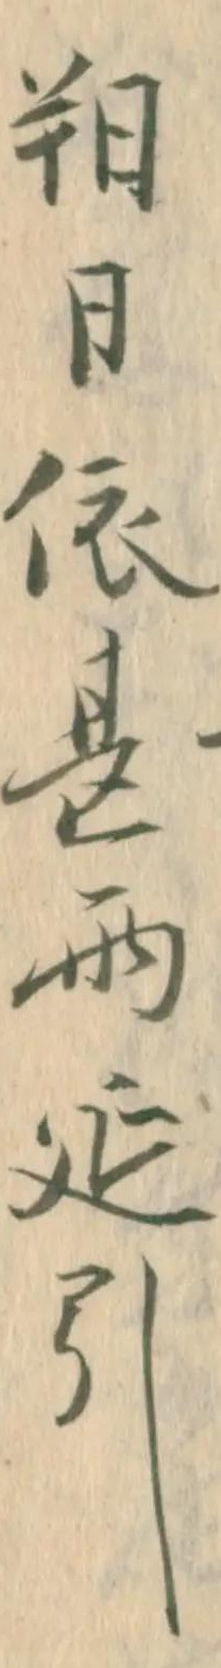朔日依甚雨延引
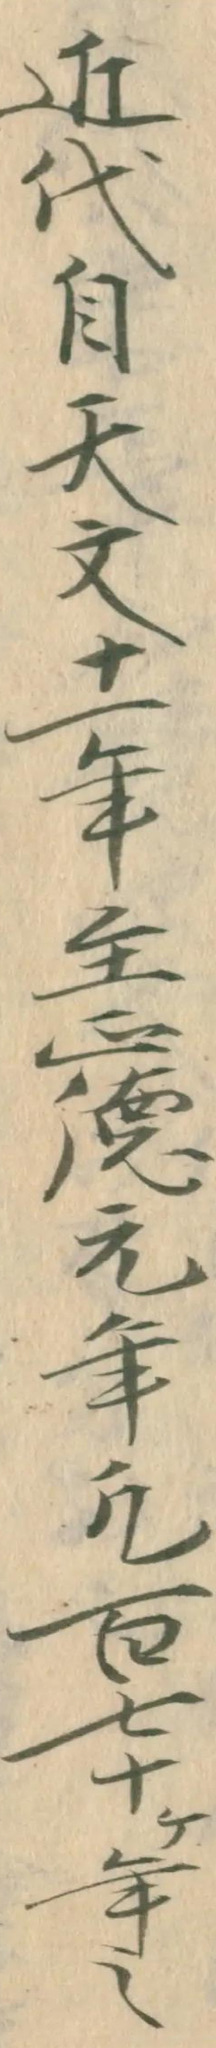近代自天文十一年至正徳元年凡百七十ケ年之
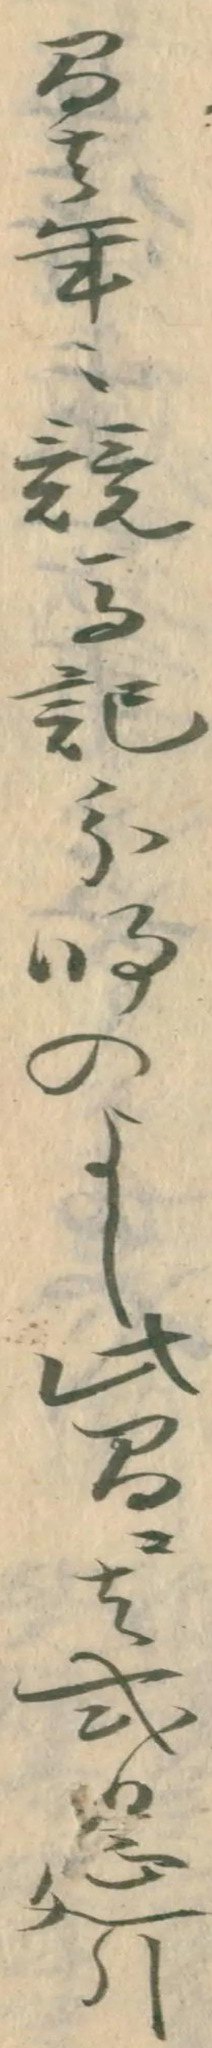間者年々競馬記分明のよし此間ニ者式日延引

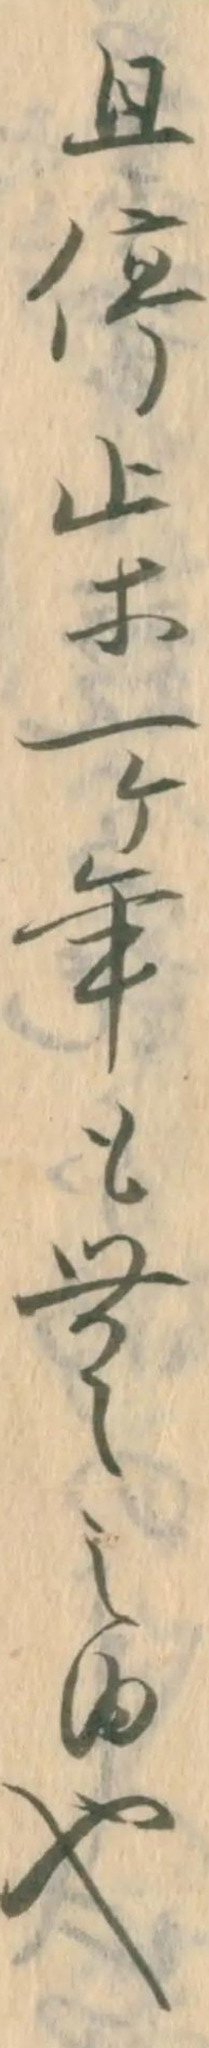且停止等一ケ年も無之由也
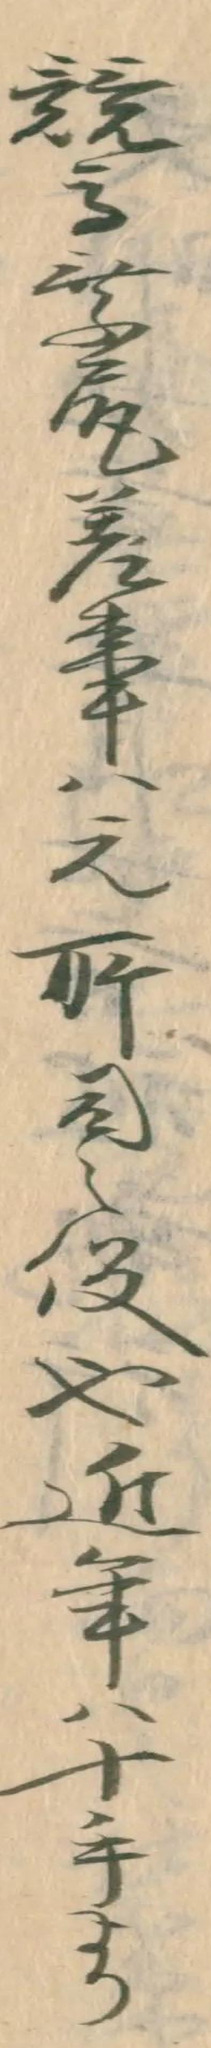一競馬乗尻差事ハ元所司之役也近年ハ十手より
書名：賀茂社記録. 第12冊
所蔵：国立国会図書館 National Diet Library, JAPAN
